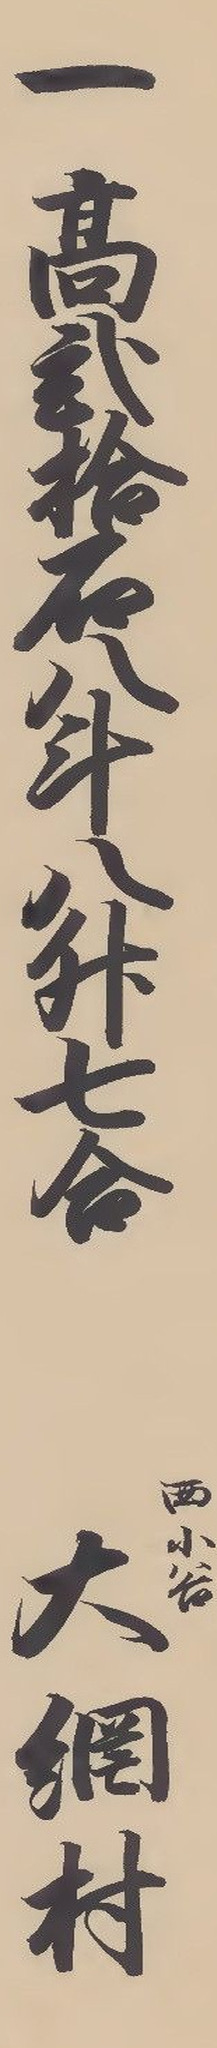一高弐拾石八斗八升七合大網村
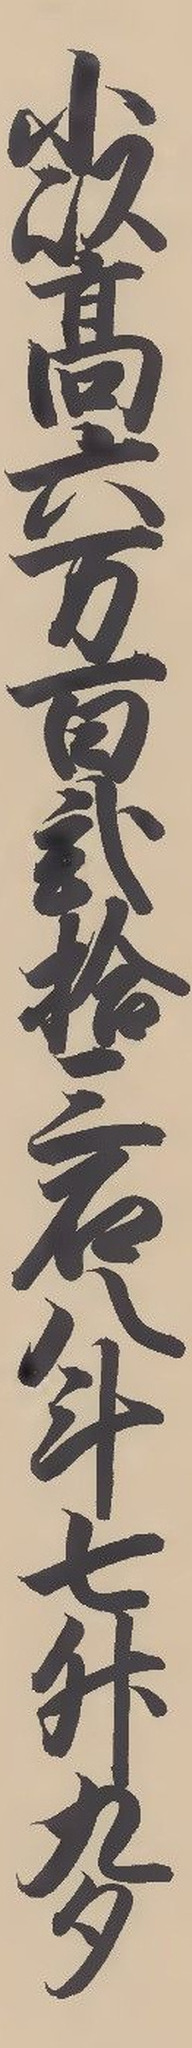小以高六万百弐拾三石八斗七升九勺
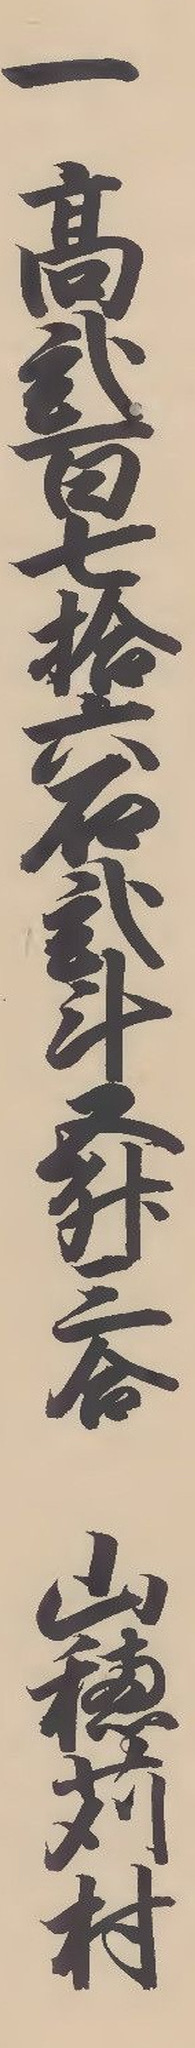一高弐百七拾六石弐斗五升三合山穂苅村
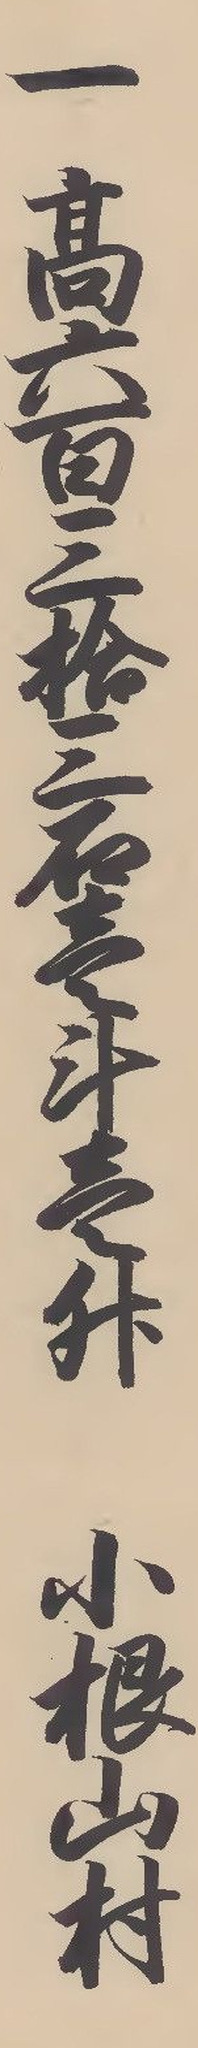一高六百三拾三石壱斗壱升小根山村
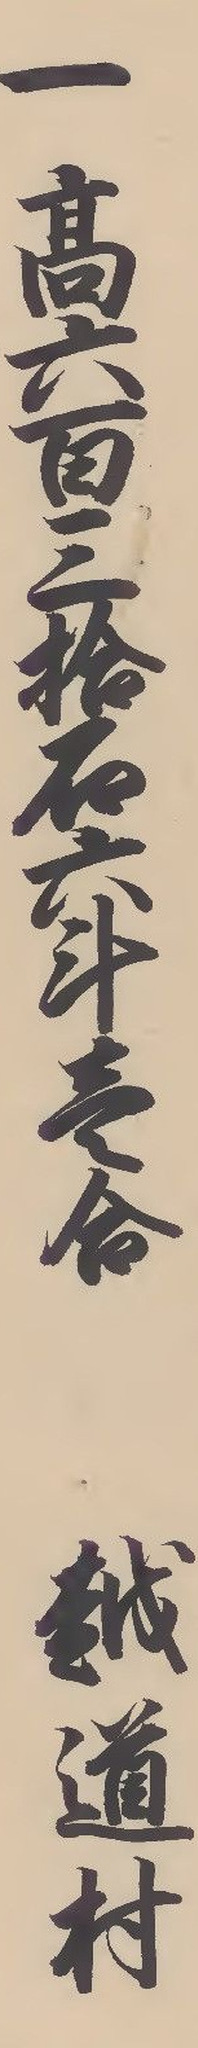一高六百三拾石六斗壱合越道村

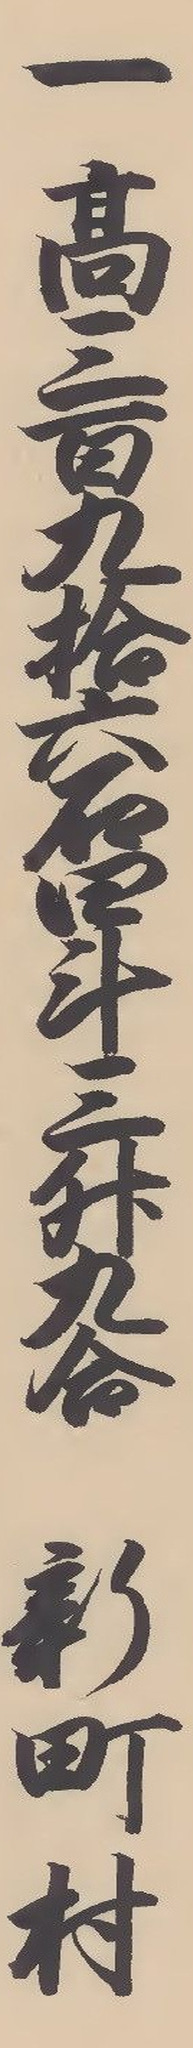一高三百九拾六石四斗三升九合新町村
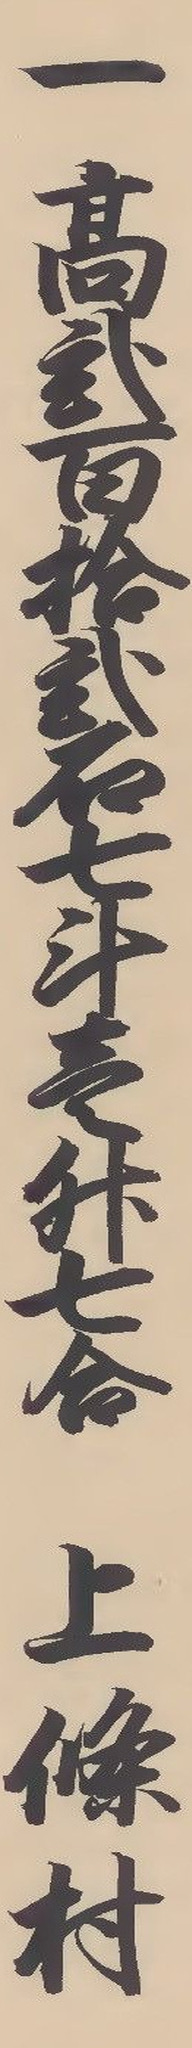一高弐百拾弐石七斗壱升七合上條村
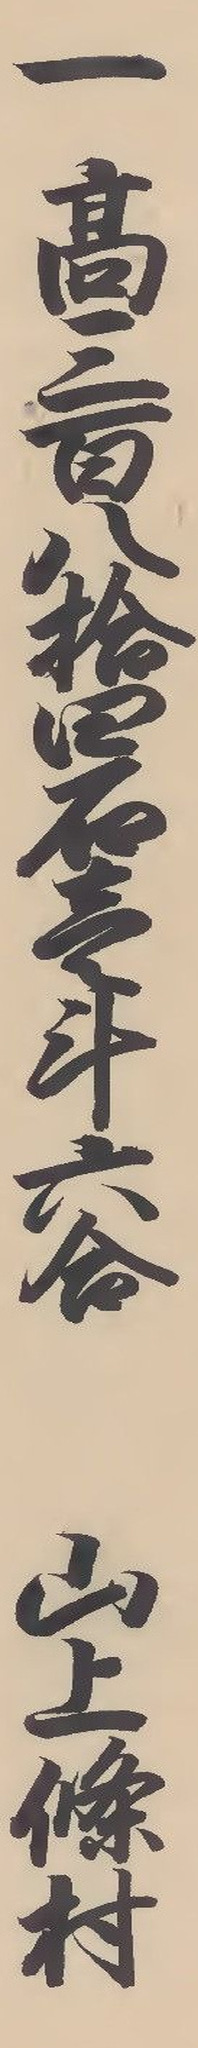一高三百八拾四石壱斗六合山上條村
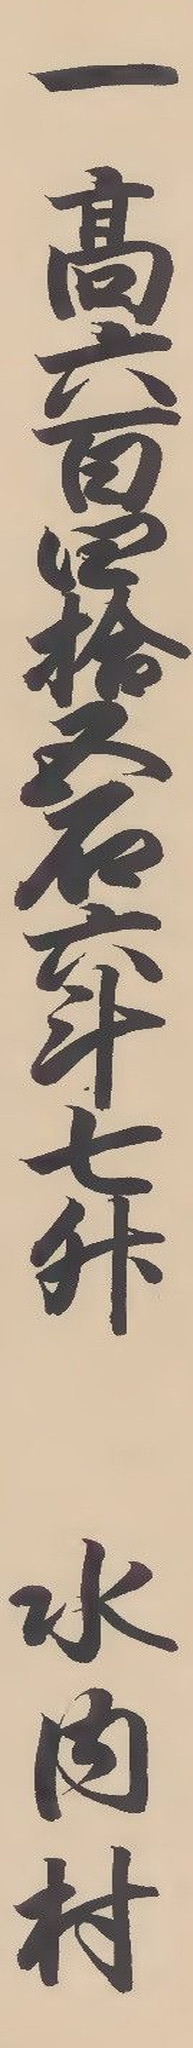一高六百四拾五石六斗七升水内村
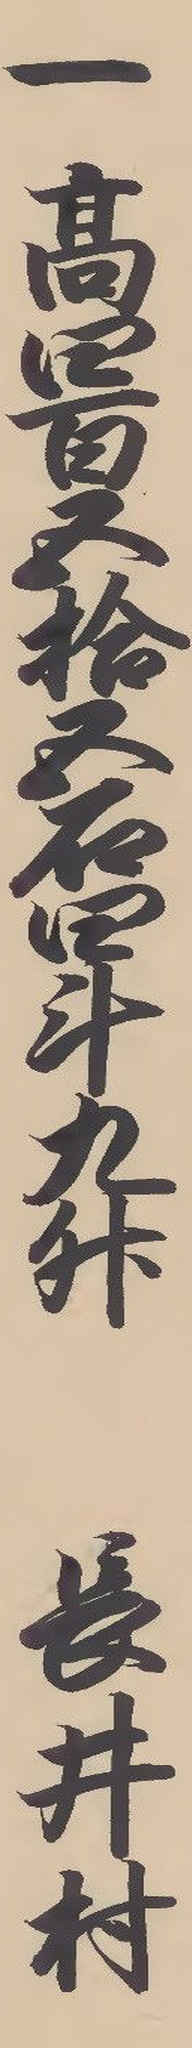一高四百五拾五石四斗九升長井村
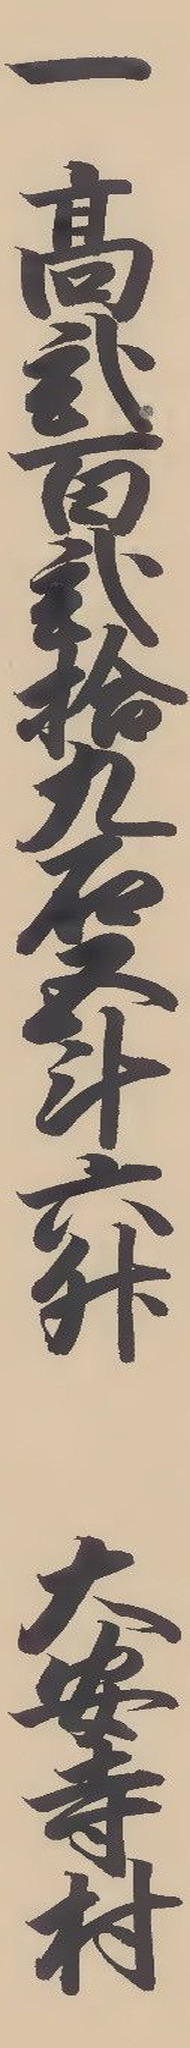一高弐百弐拾九石五斗六升大安寺村
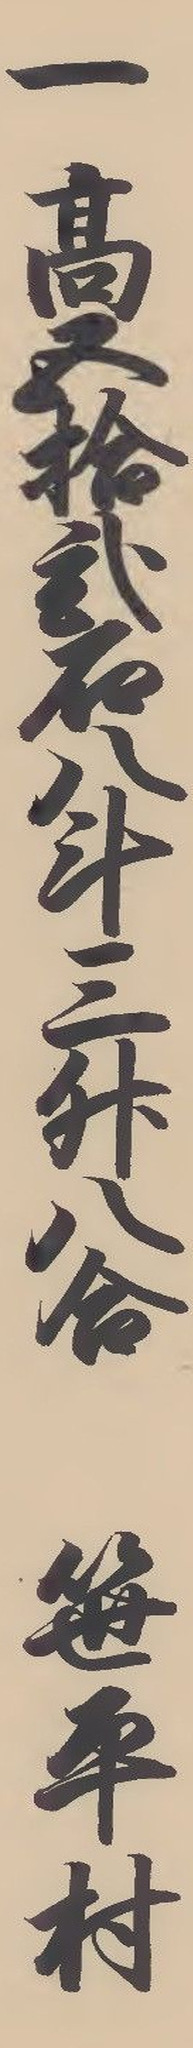一高五拾弐石八斗三升八合笹平村
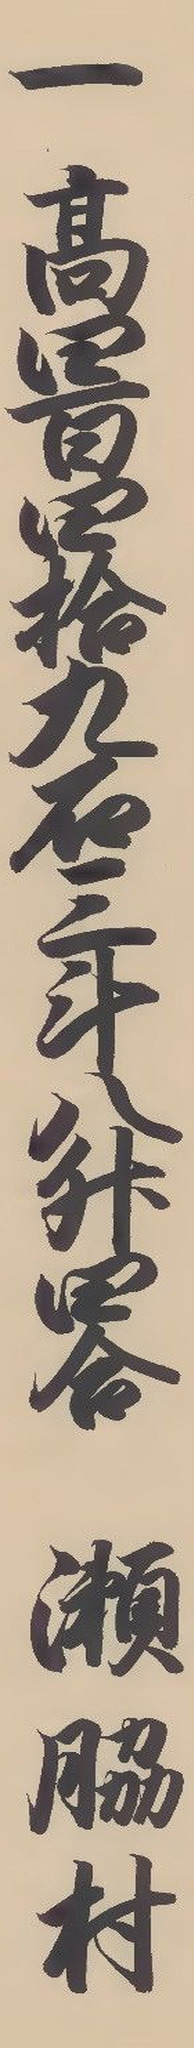一高四百四拾九石三斗八升四合瀬脇村

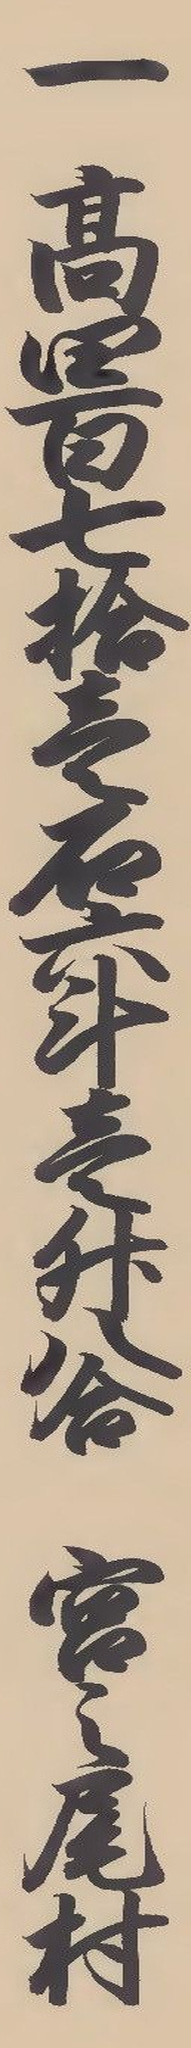一高四百七拾壱石六斗壱升八合宮之尾村
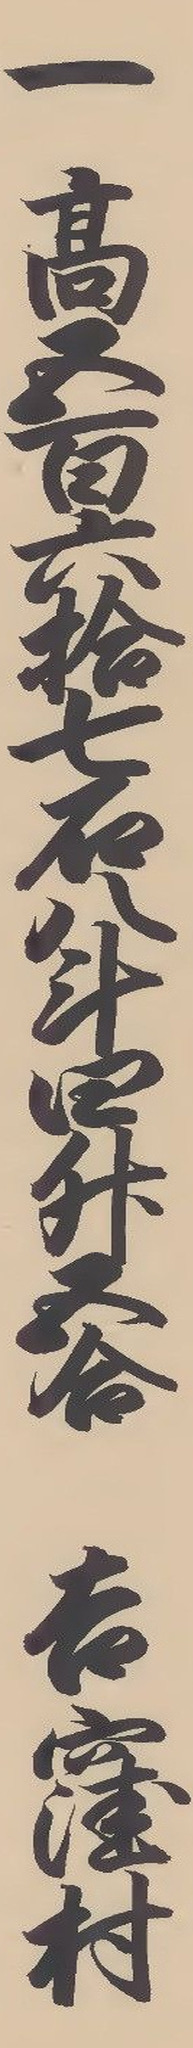一高五百六拾七石八斗四升五合吉窪村
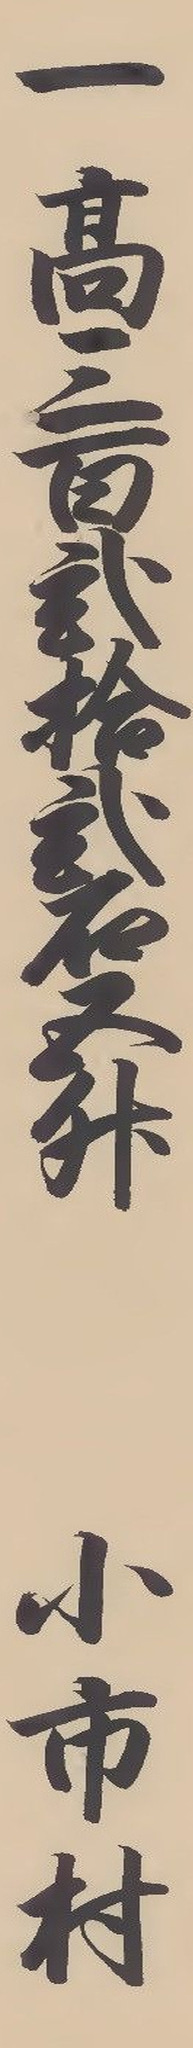一高三百弐拾弐石五升小市村
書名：信濃国郷帳
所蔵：国立公文書館 National Archives of Japan
